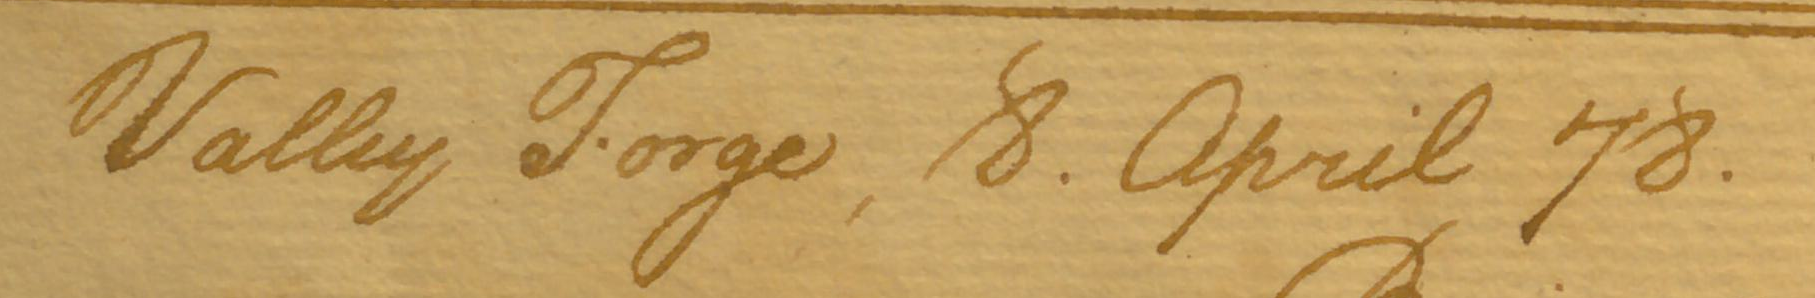Valley Forge, 8. April 78.
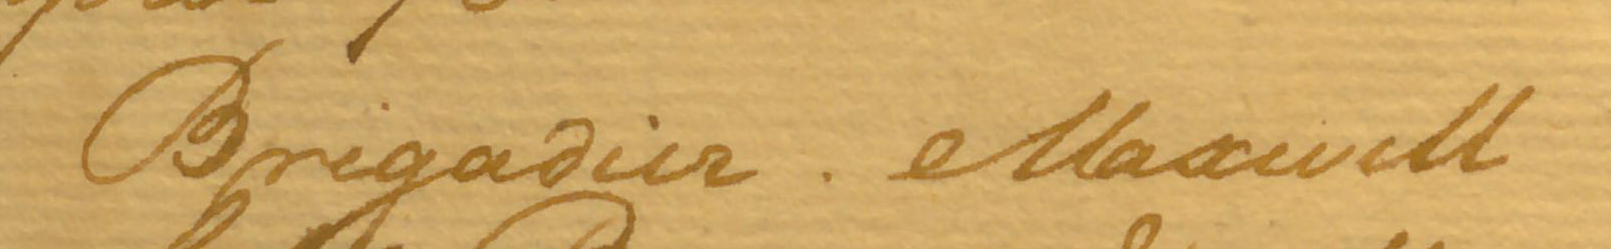Brigadier. Maxwell
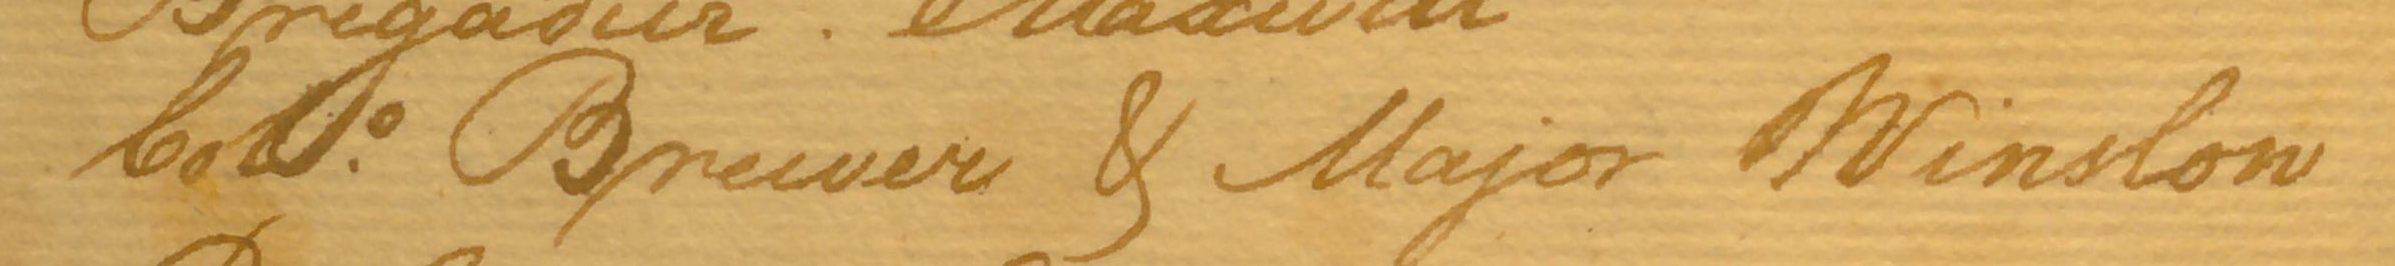Col^o. Brewer & Major Winslow
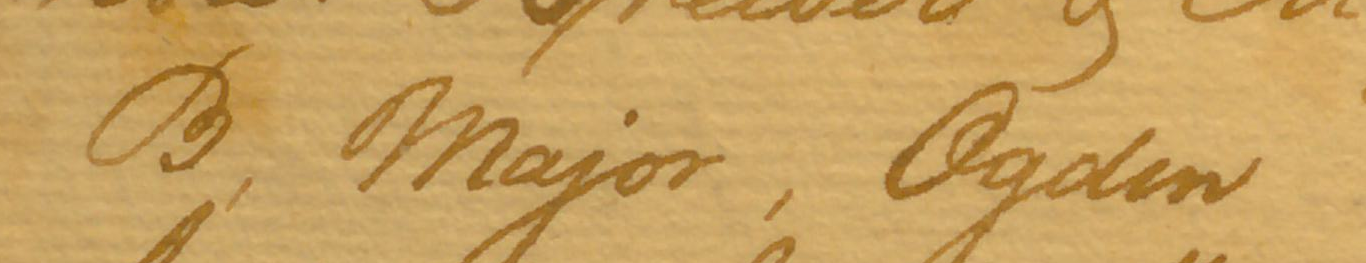B. Major. Ogden
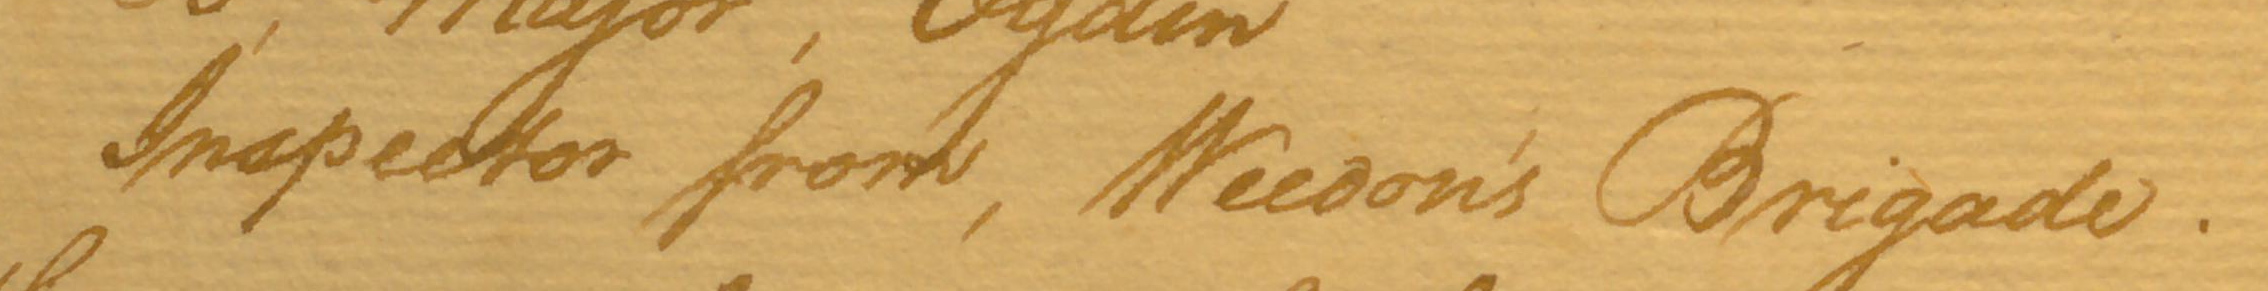Inspector from, Weedon's Brigade.
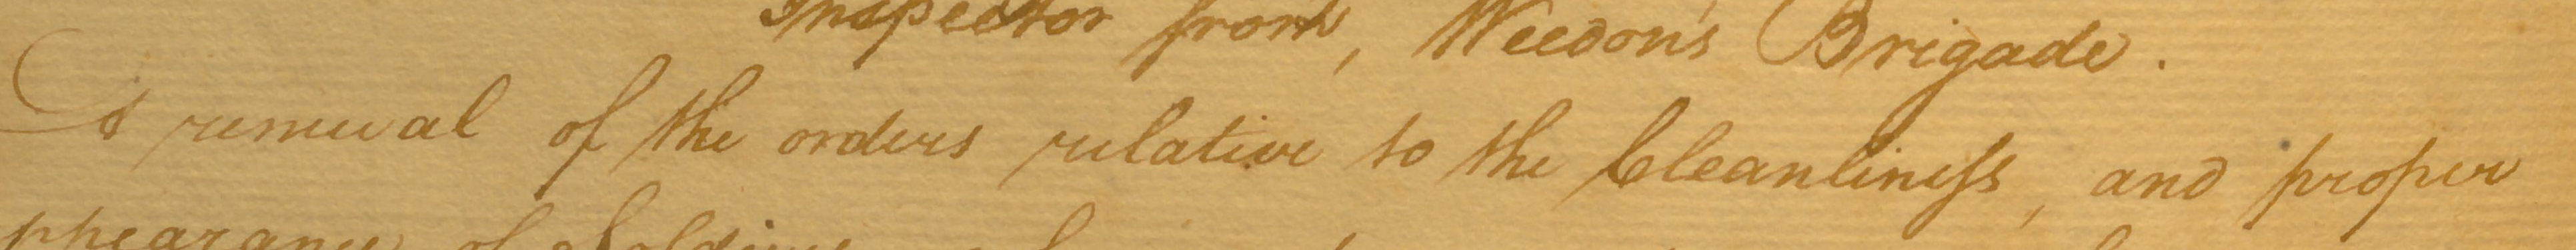A renewal of the orders relative to the Cleanliness, and proper
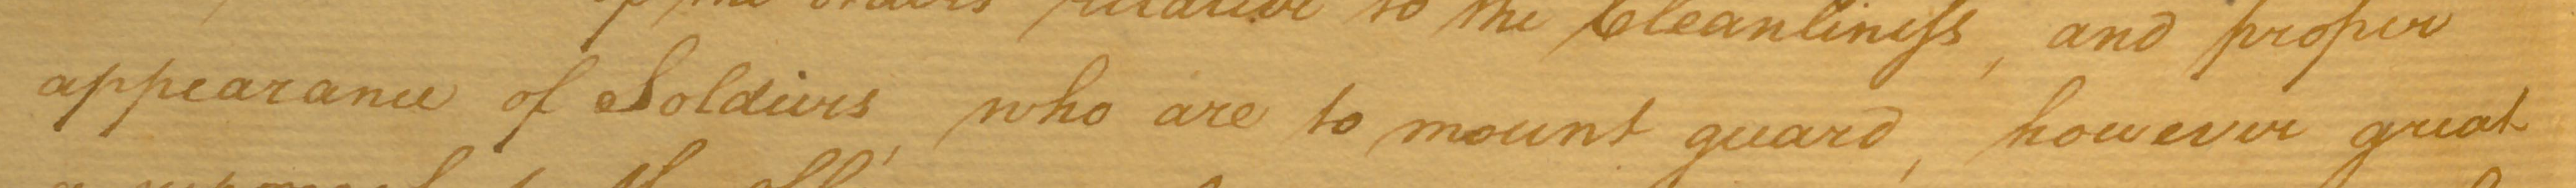appearance of Soldiers who are to mount guard, however great
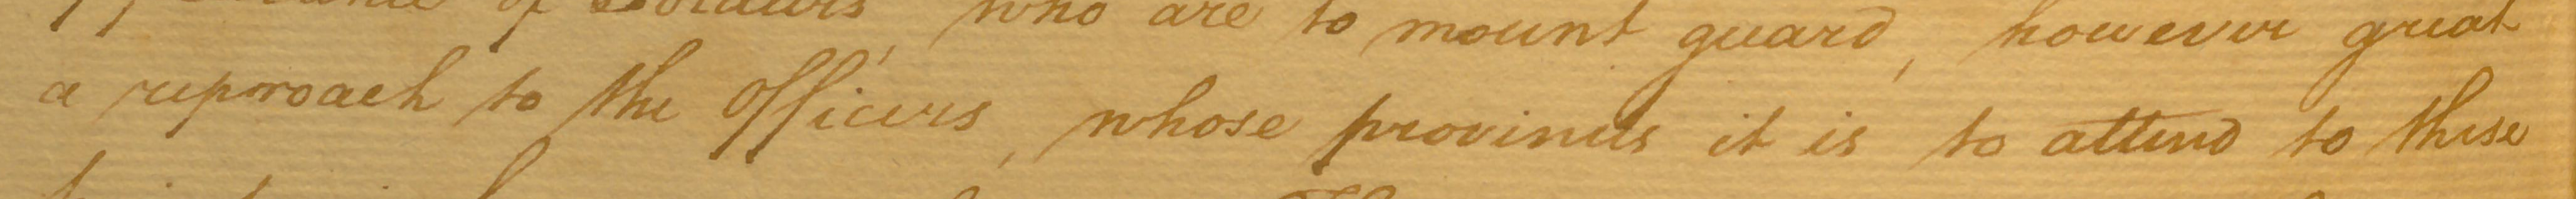a reproach to the officers whose provinces it is to attend to these
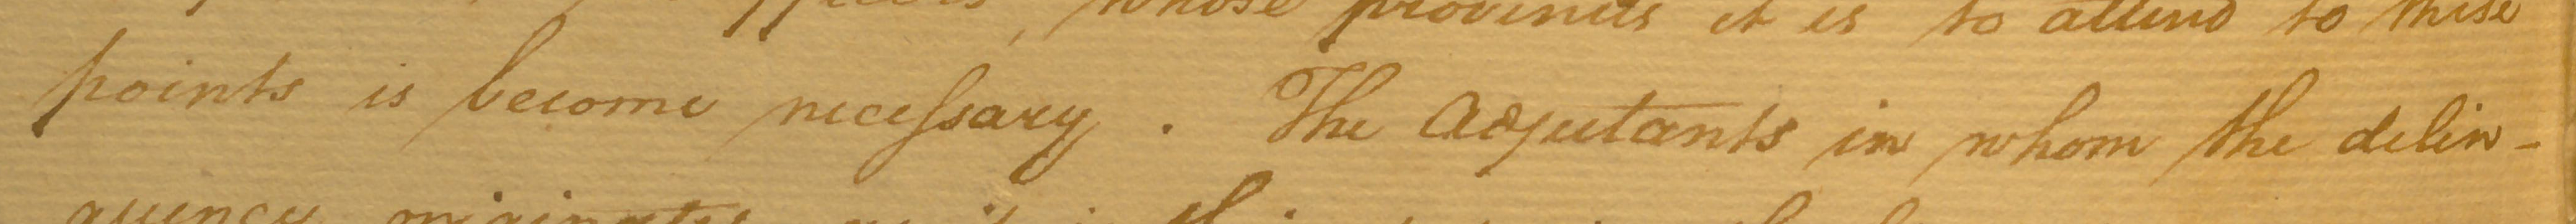points is become necessary. The Adjutants in whom the delin-
